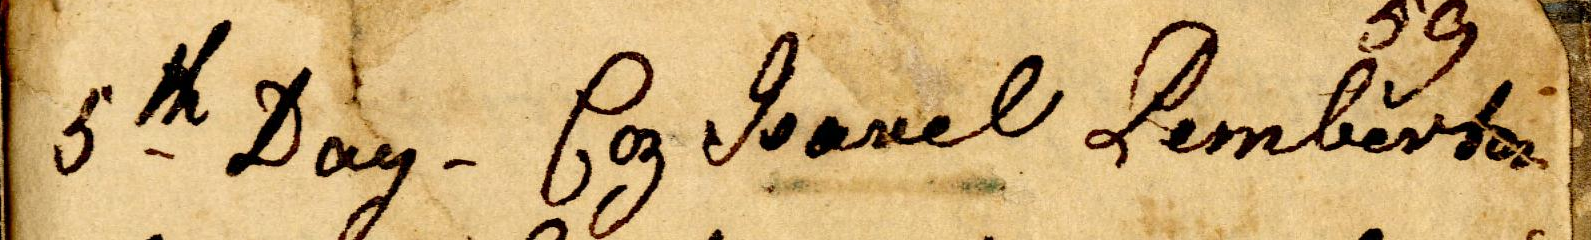5^th Day- Coz Isarel Pemberton
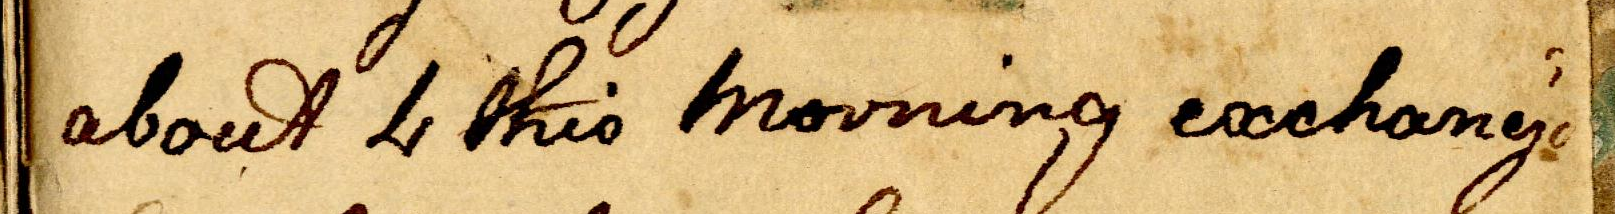about 4 this morning exchang'd
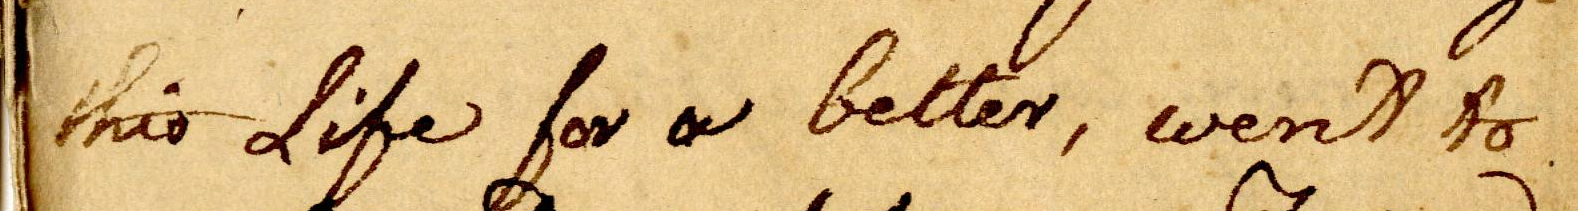this Life for a better, went to
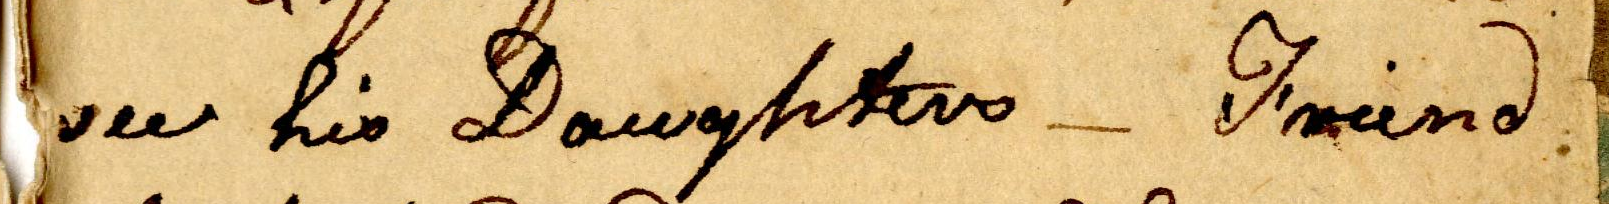see his Daughters- Friend
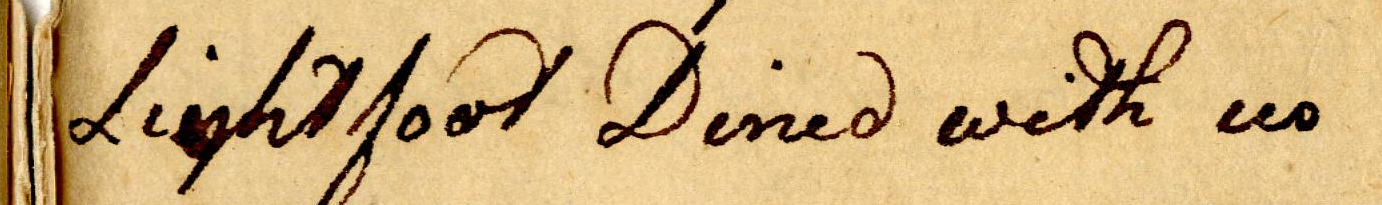Lightfoot Dined with us
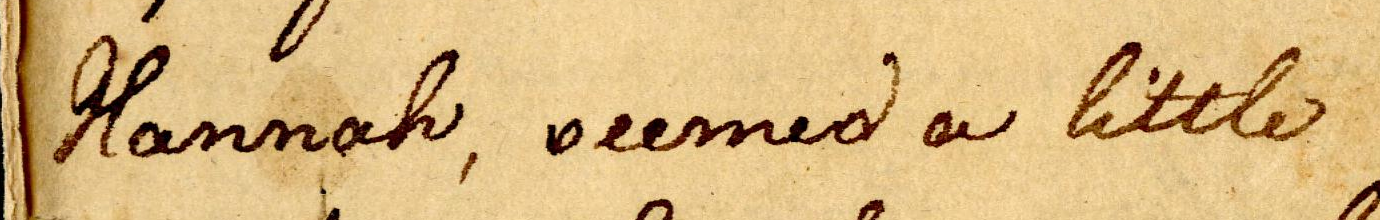Hannah, seemed a little
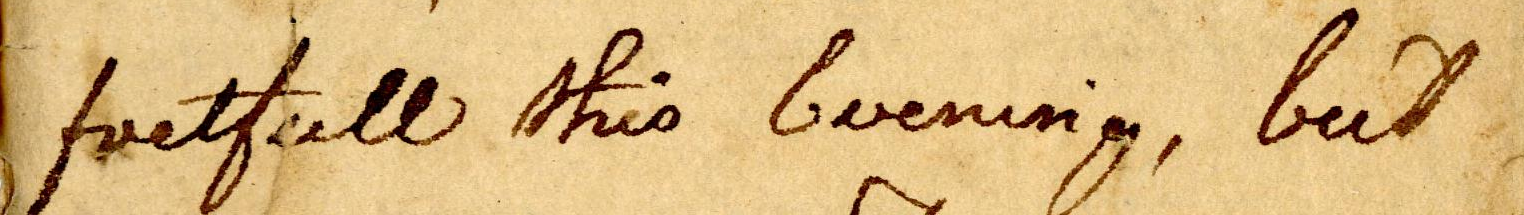fretfull this Evening, but
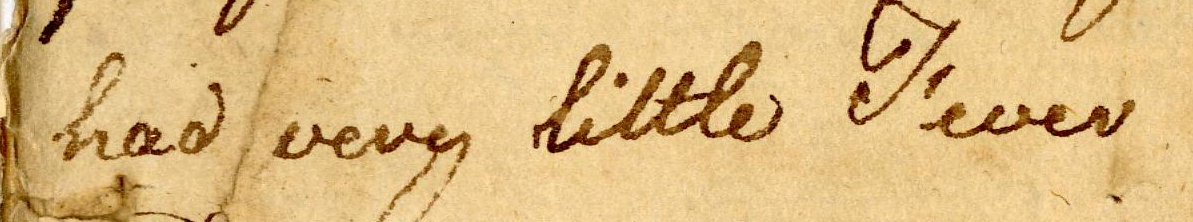had very little Fever
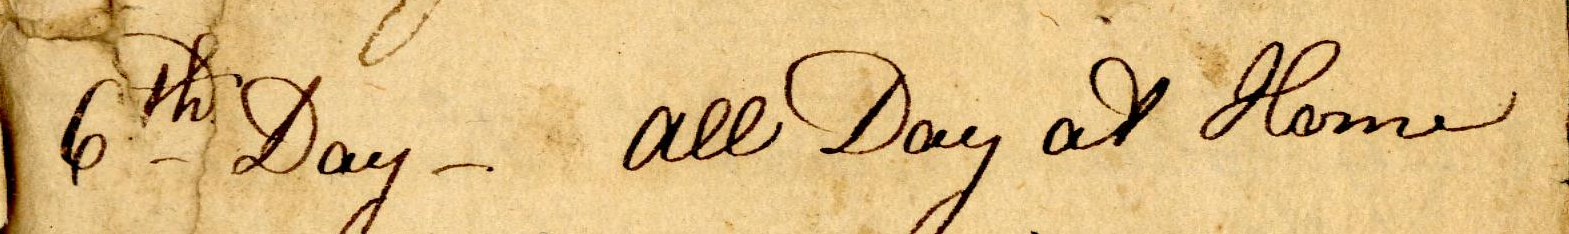6^th Day- All Day at Home
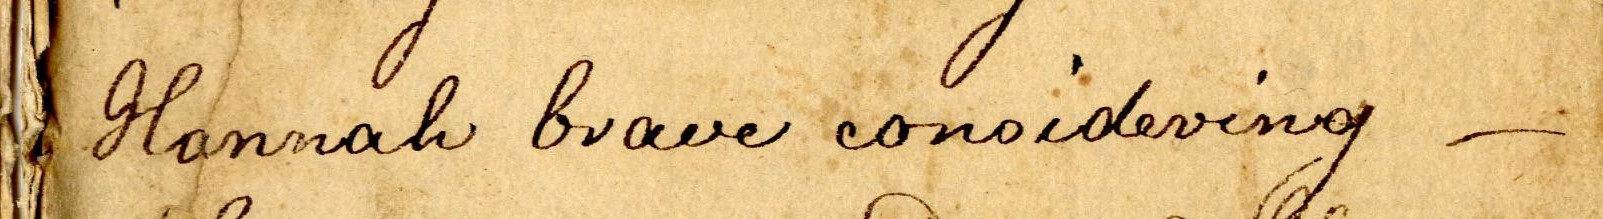Hannah brave considering-
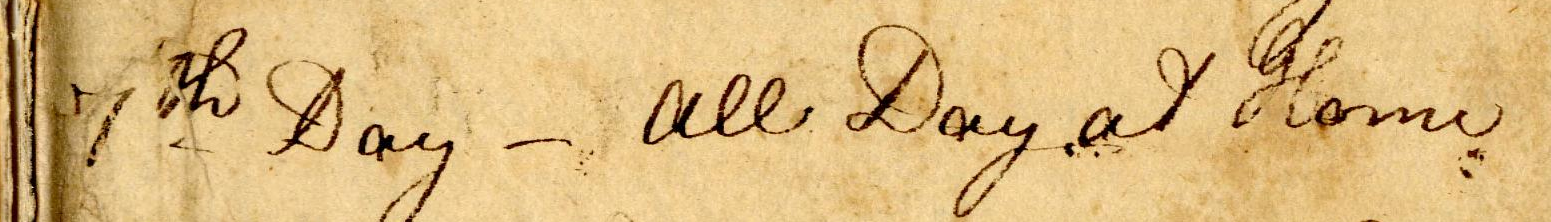7^th Day- All Day as Home
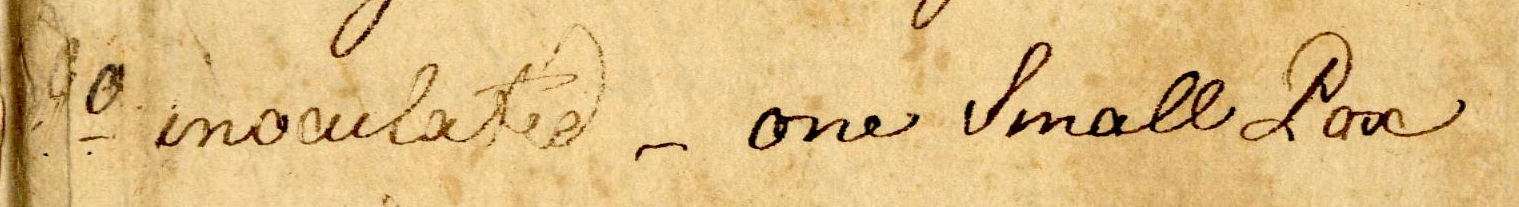- inoculated- one Small Pox
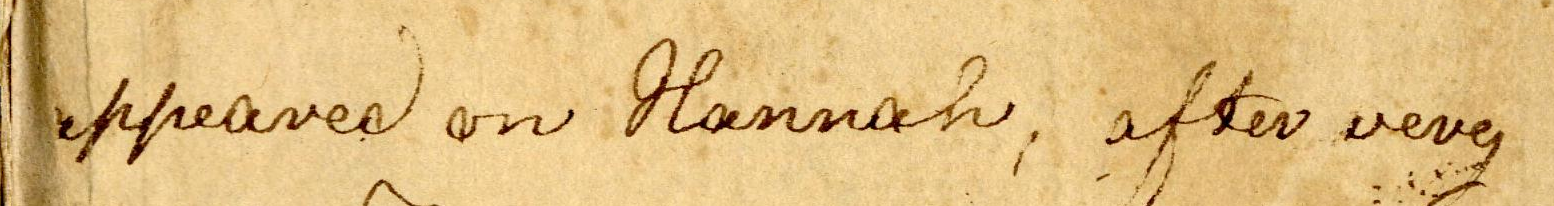appeared on Hannah, after very
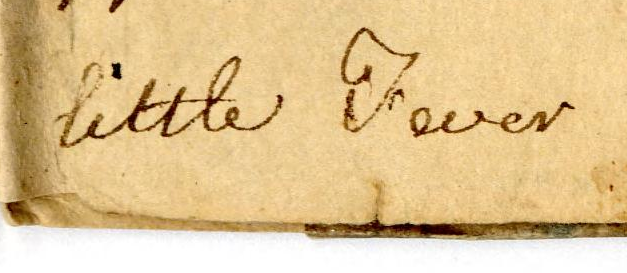little Fever
